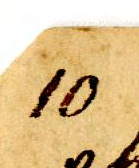10
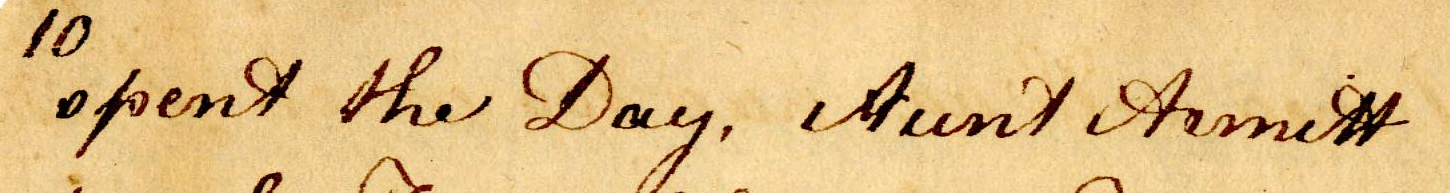spent the Day, Aunt Armitt
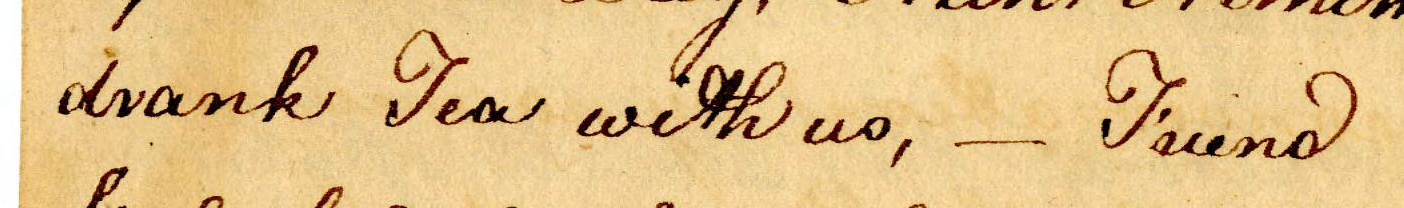drank Tea with us,- Friend
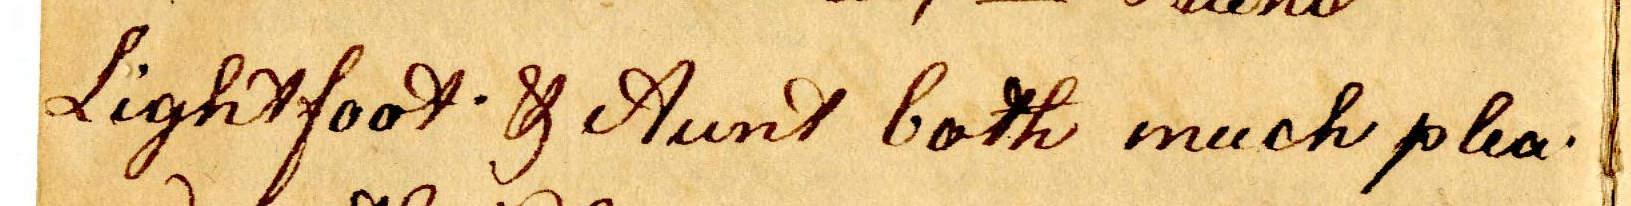Lightfoot & Aunt both much plea
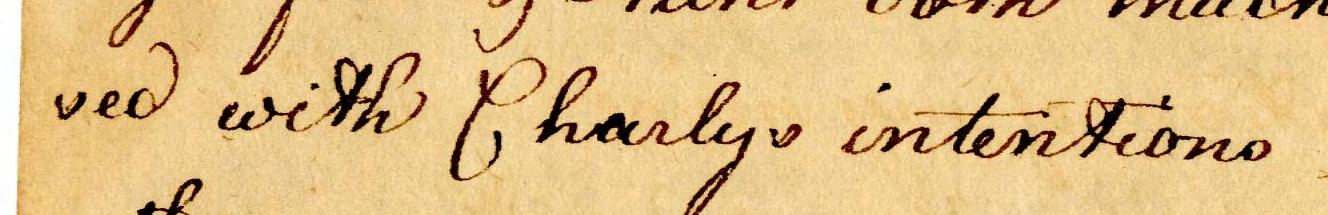sed with Charlys intentions
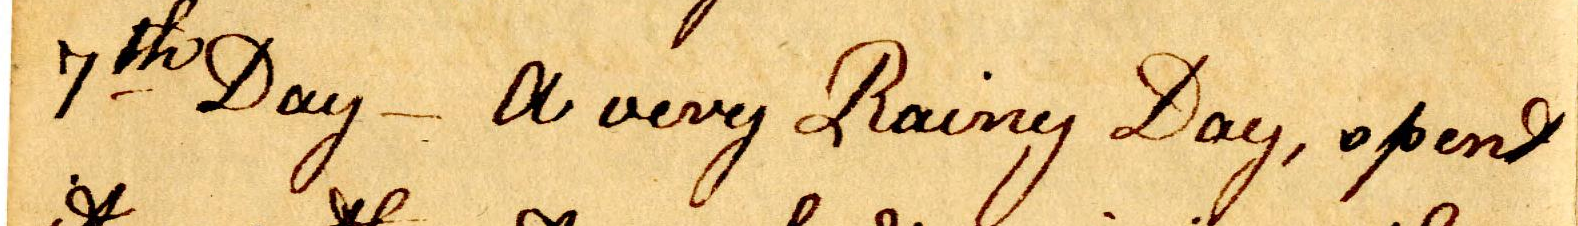7^th Day- A very Rainy Day, spent
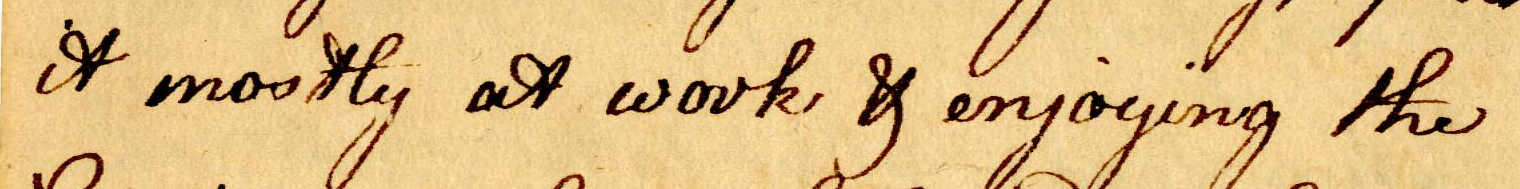it mostly at work & enjoying the
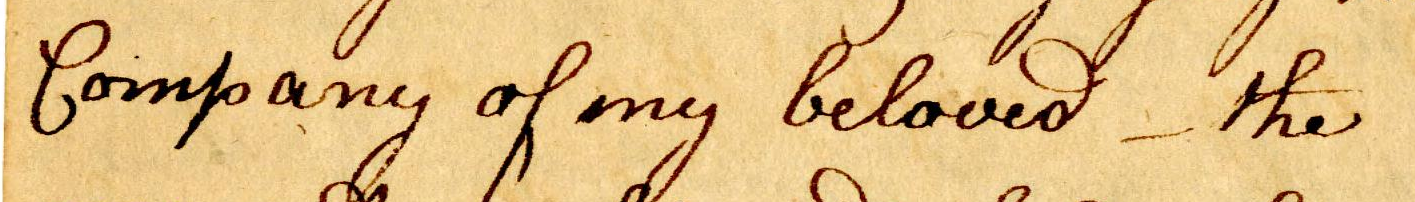Company of my beloved- the
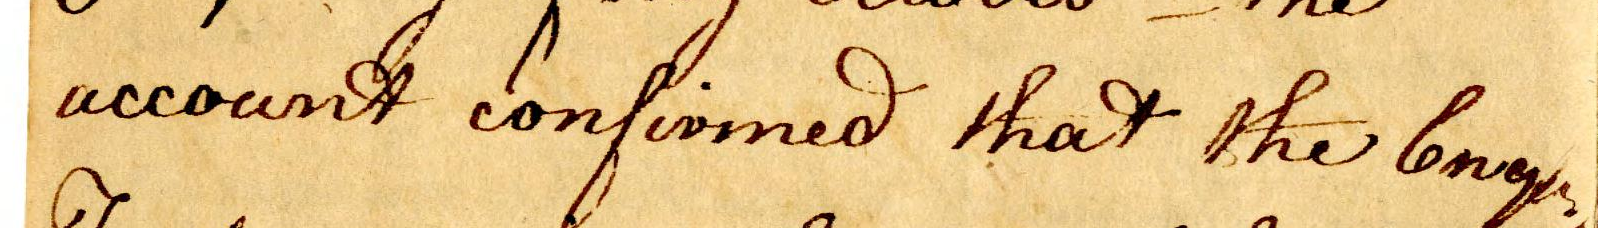account confirmed that the English
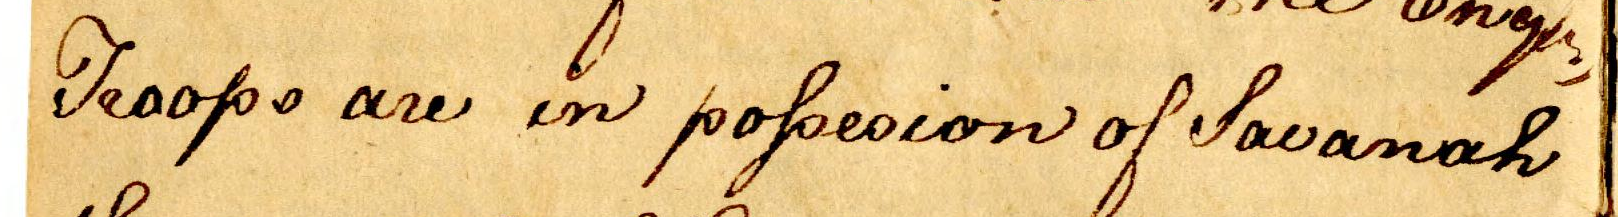Troops are in possesion of Savanah
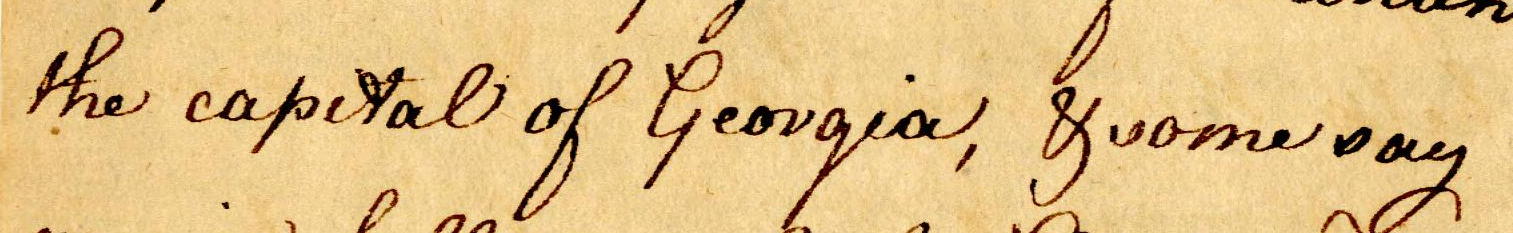the capital of Georgia, & some say
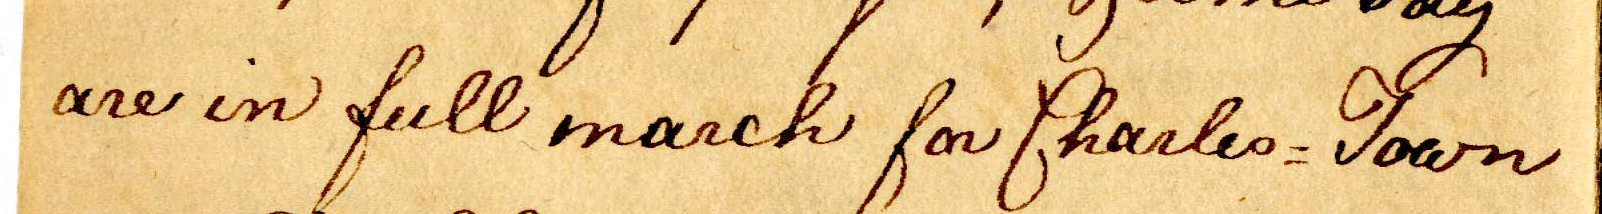are in full march for Charles-Town
